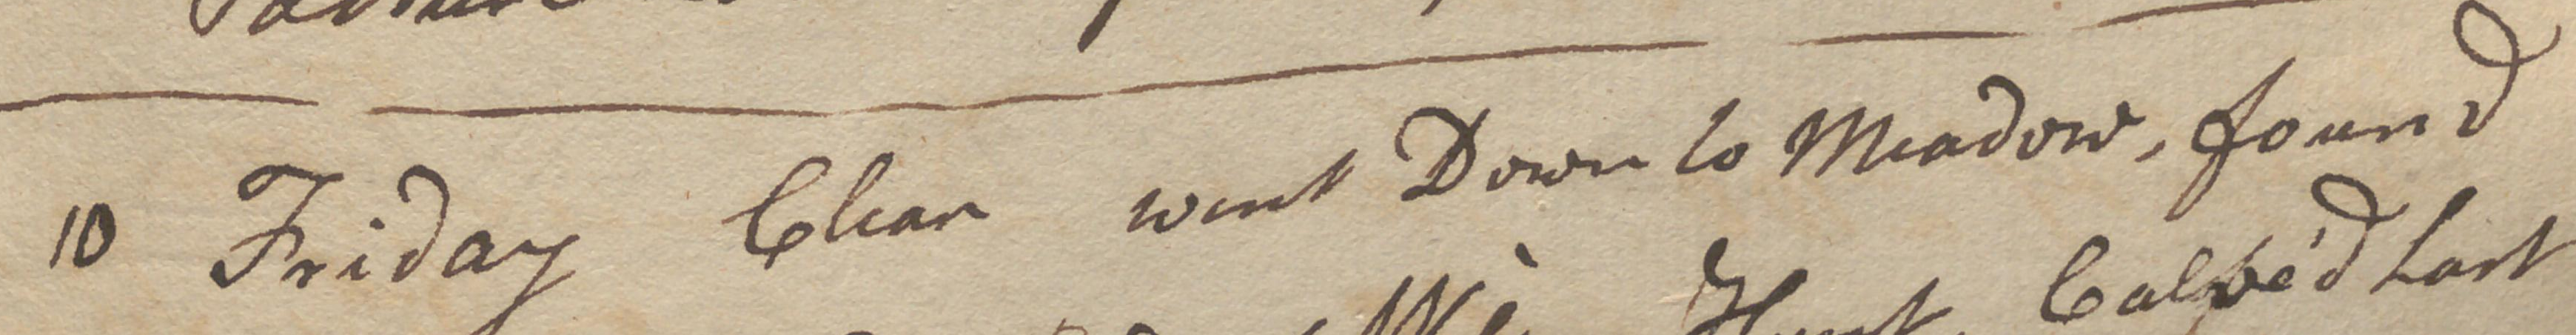10 Friday Clear went Down to Meadow, found
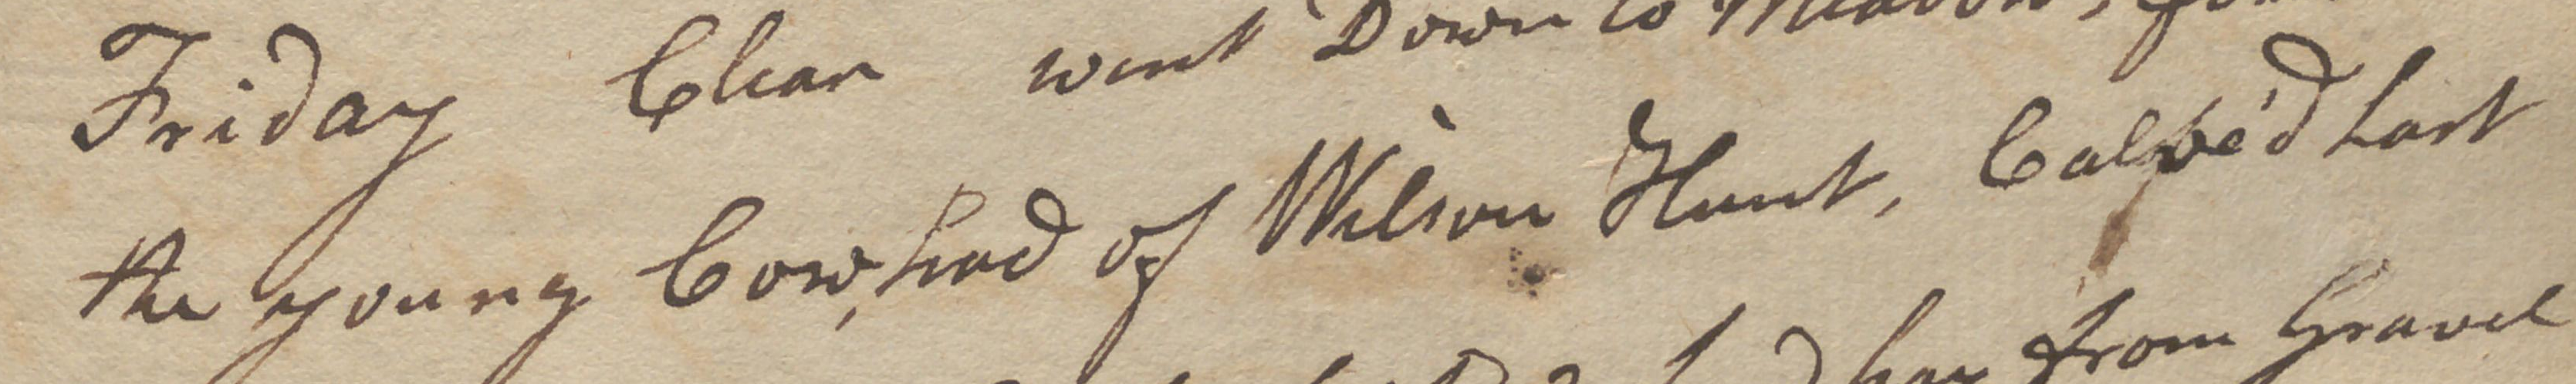the young Cow had of Wilson Hunt, Calve'd Last
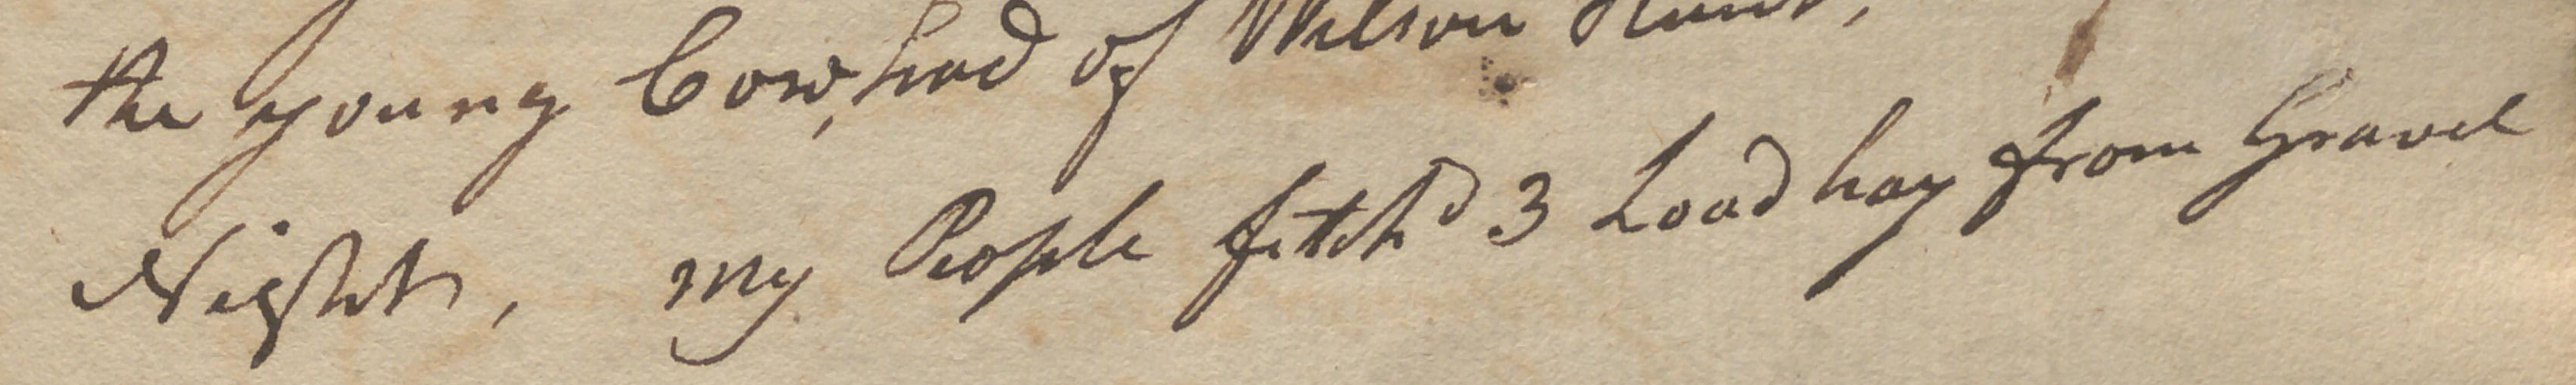Night, my People fetch^d 3 Load hay from Gravel
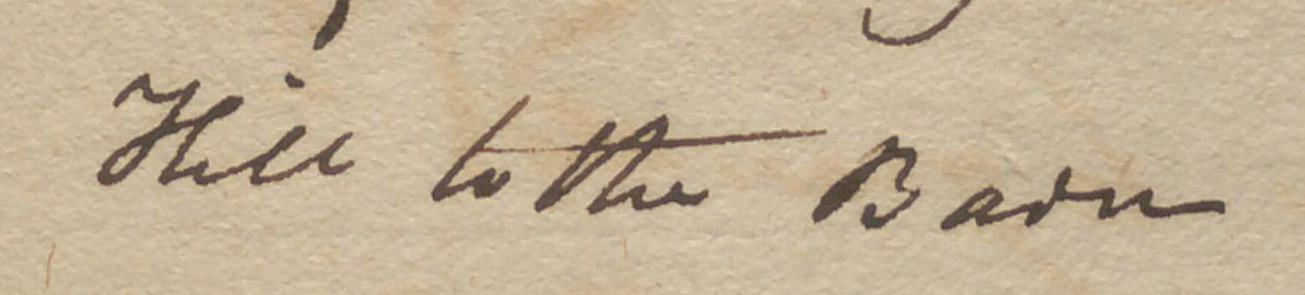Hill to the Barn
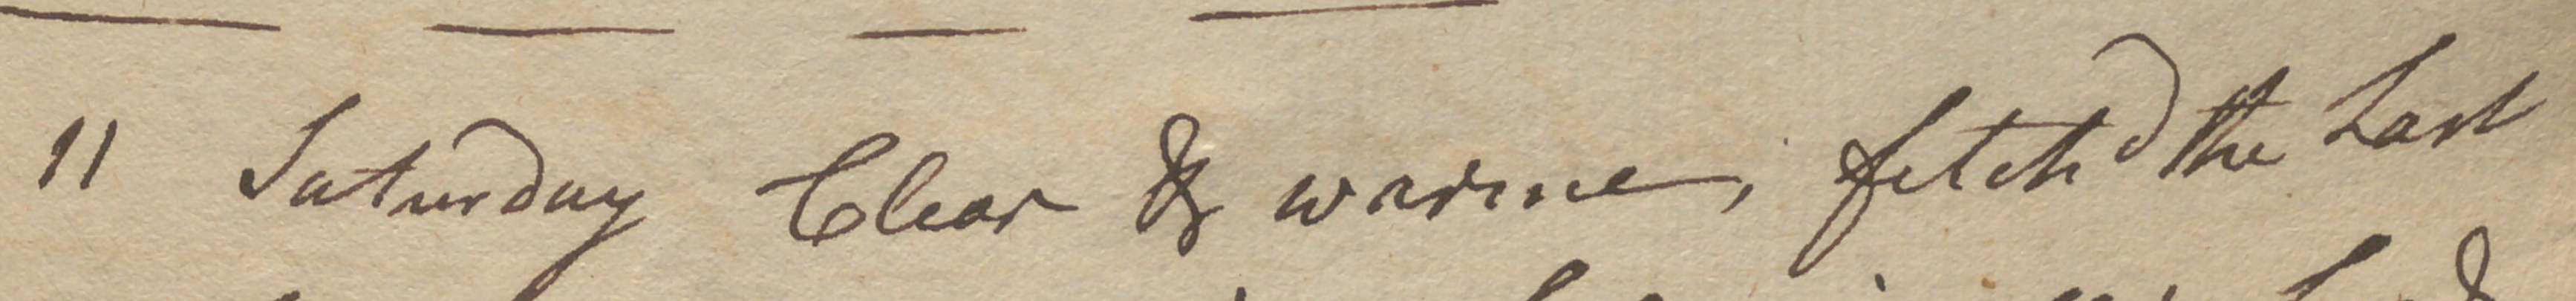11 Saturday Clear & warme, fetch'd the Last
